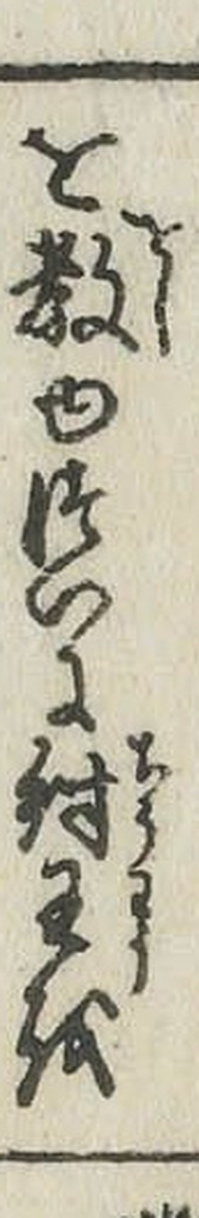を教ゆついに紂王を
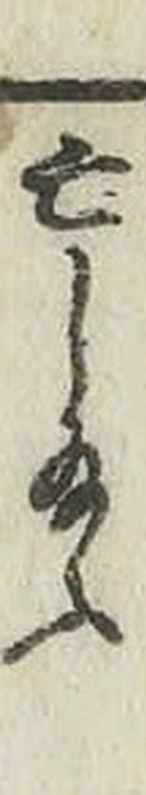亡し給ふ
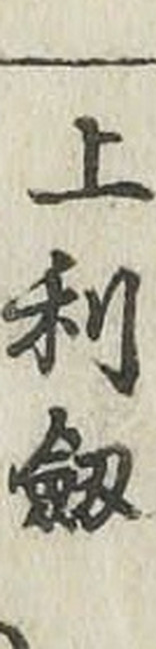上利剣
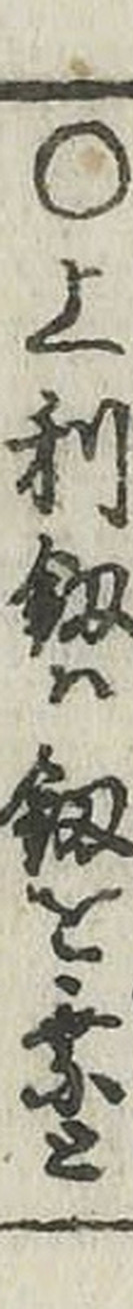○上利剣は剣を乗と
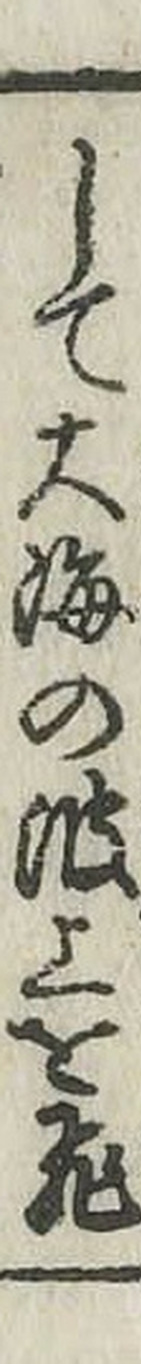して大海の波上を飛
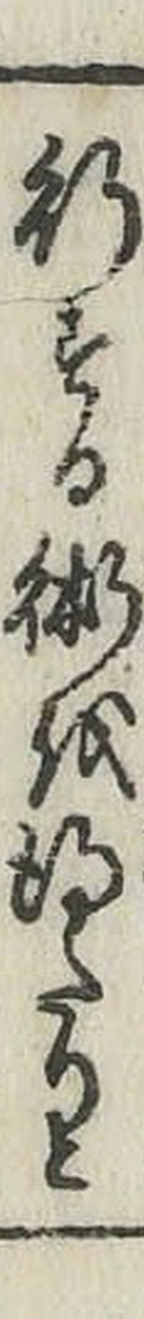行する術を得たりと

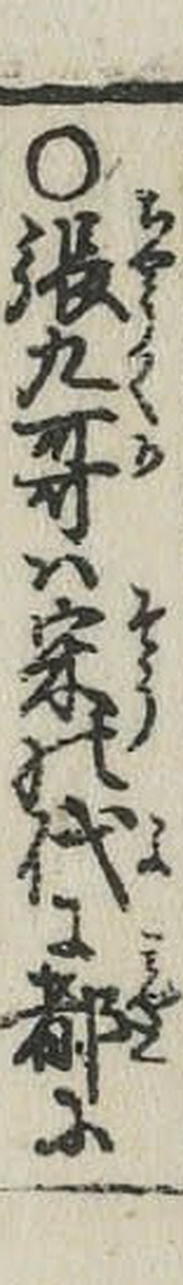○張九哥は宋の代に都に
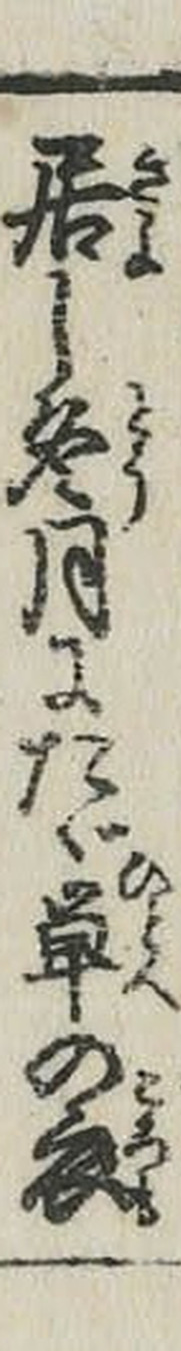居し冬月にたゞ単の衣
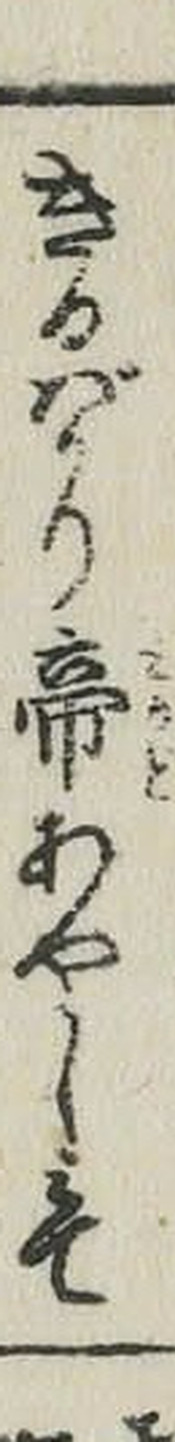きるばかり帝あやしみて
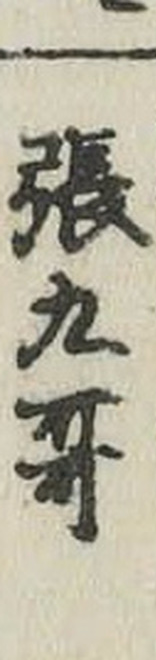張九哥
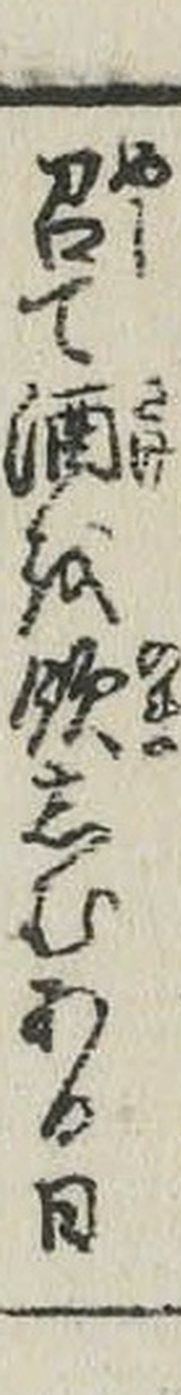召て酒を飲しむある日
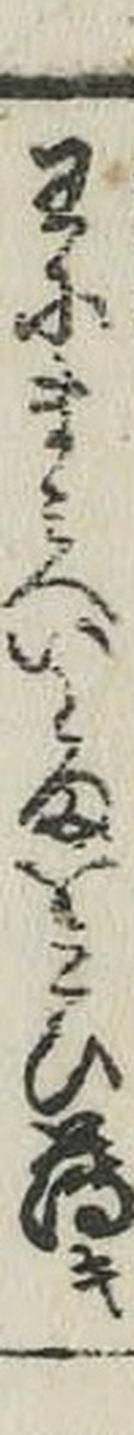王にまみへいとまをこひ薄
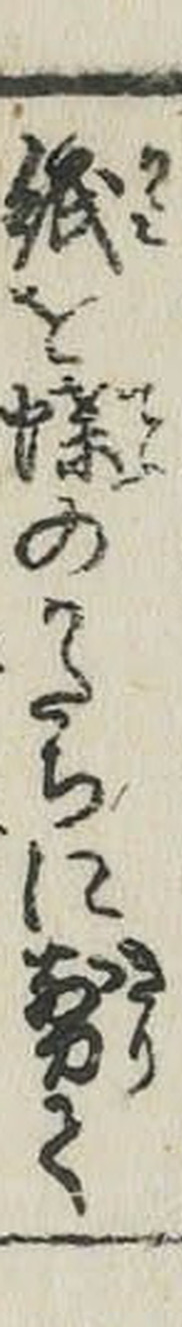紙を蝶のかたちに剪て
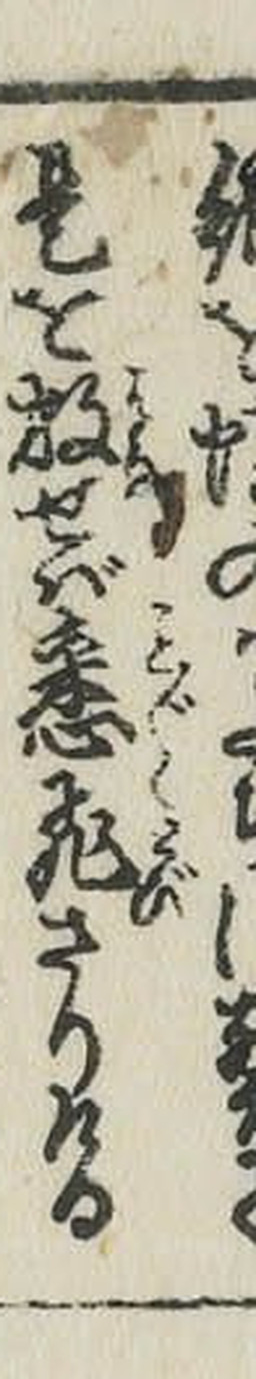是を放せば悉飛さりける
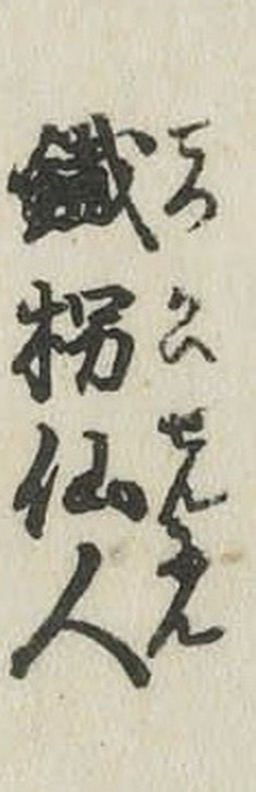鉄拐仙人
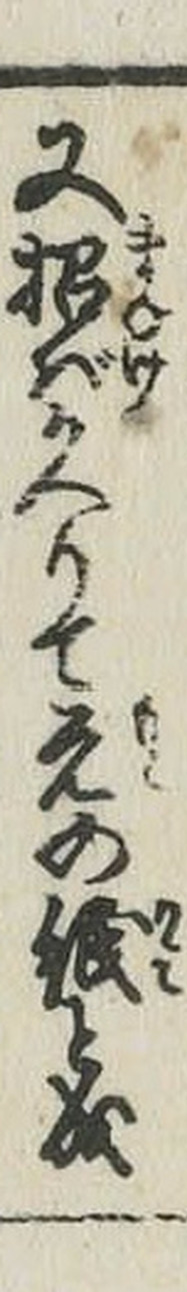又招ばかへりて元の紙と成
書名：増補頭書訓蒙図彙大成 10巻 10:巻之21
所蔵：東京学芸大学教育コンテンツアーカイブ
